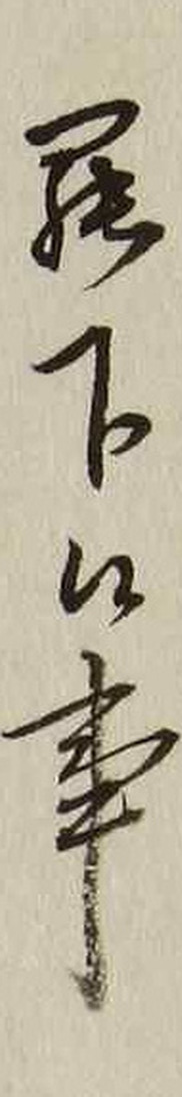罷下候事
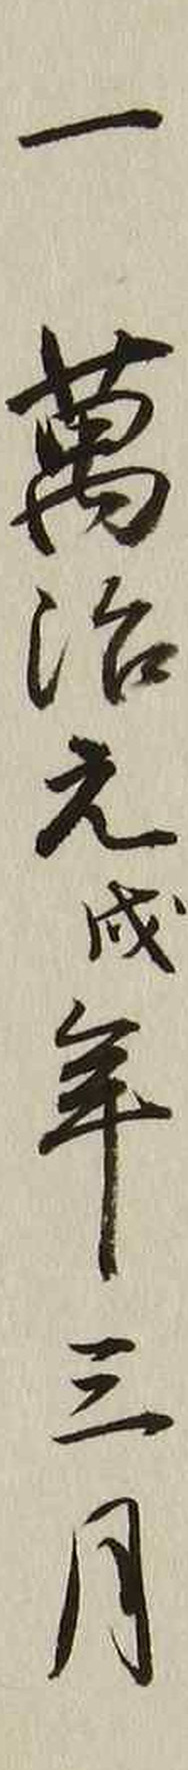一万治元戌度三月
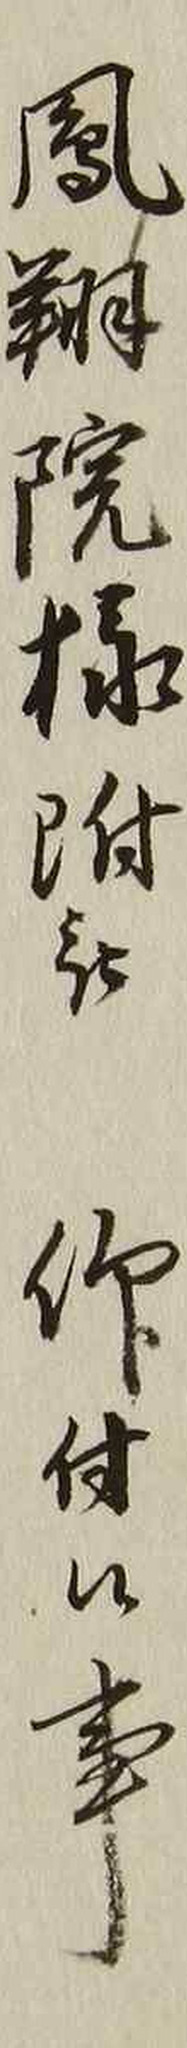鳳翔院様附被仰付候事
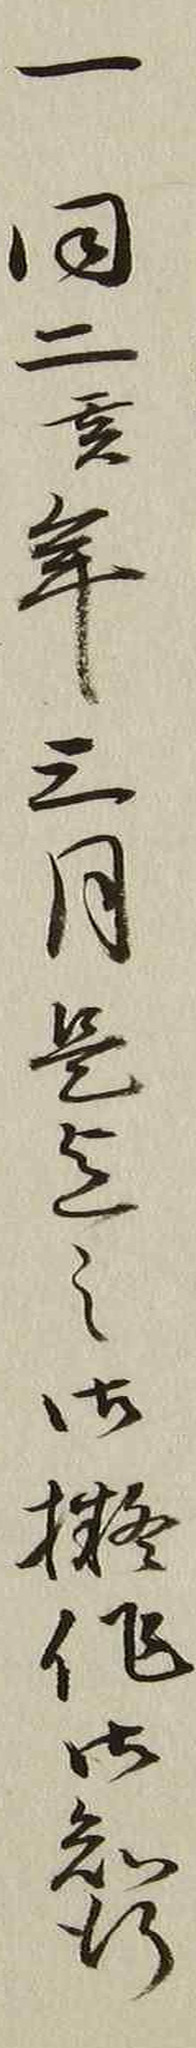一同二亥年三月是迄之御擬作御知行
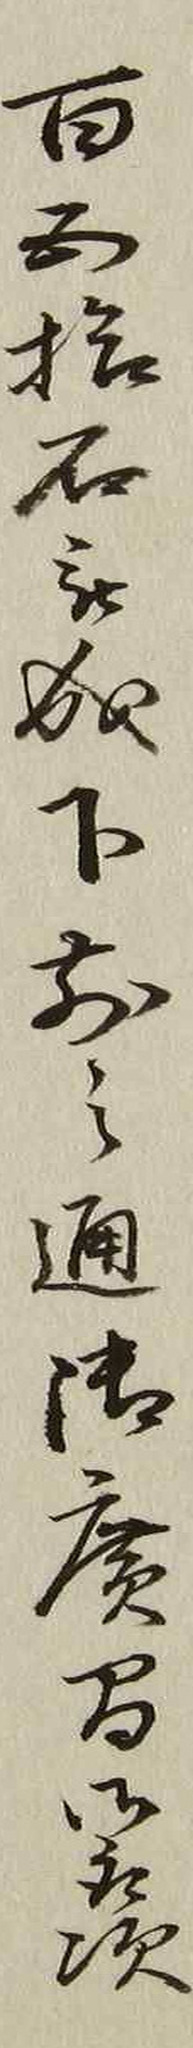百五拾石被成下前之通御広間御取次
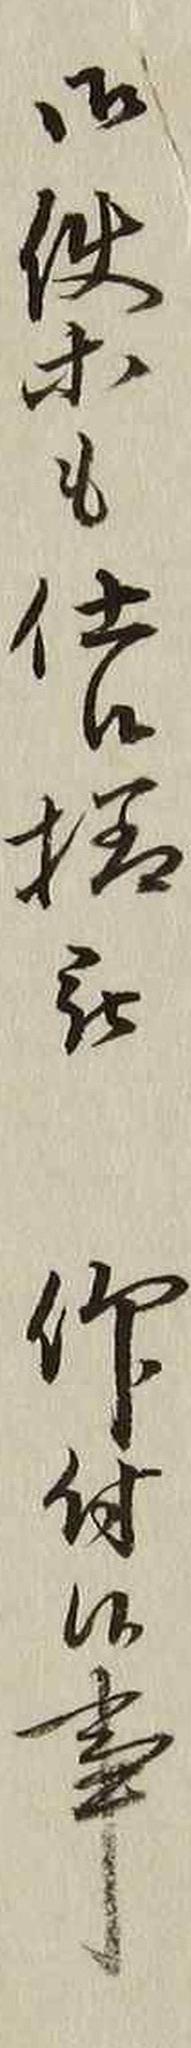御使等も仕候様被仰付候事
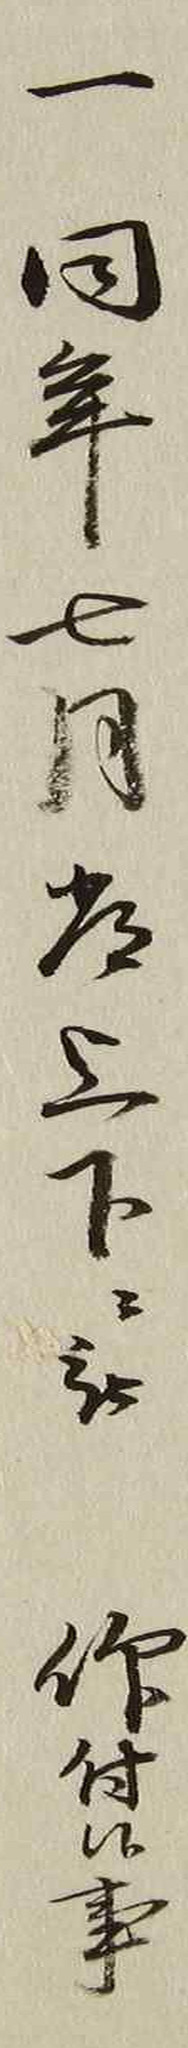一同年七月常上下ニ被仰付候事
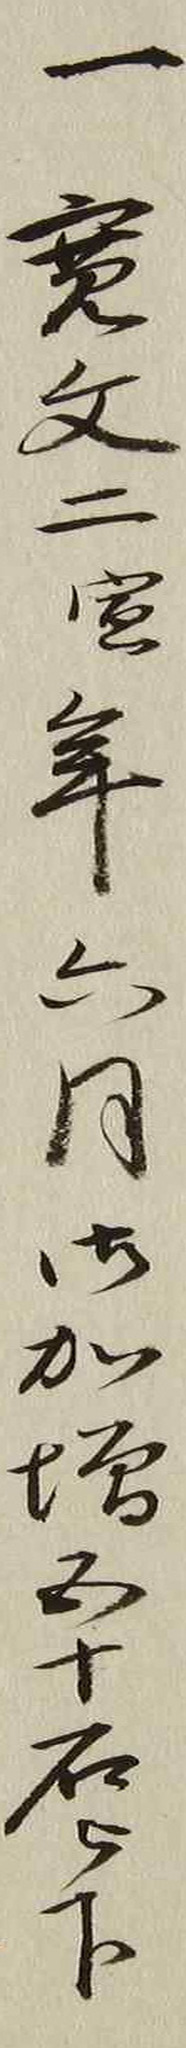一寛文二寅年六月御加増五十石被下
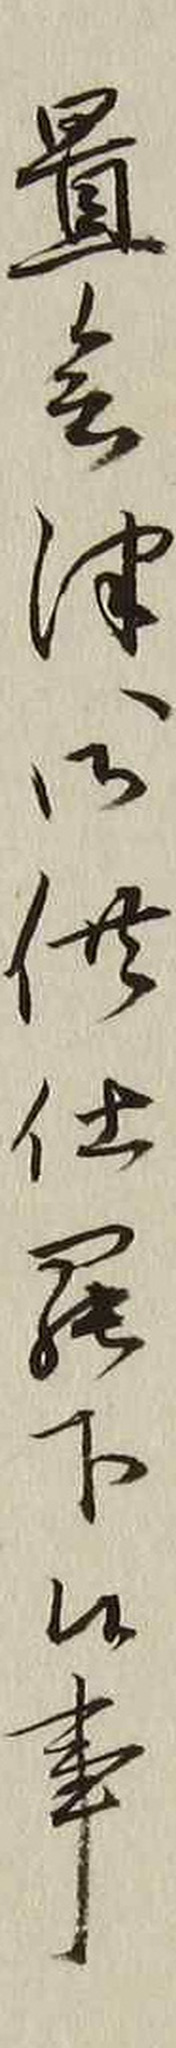置会津へ御供仕罷下候事
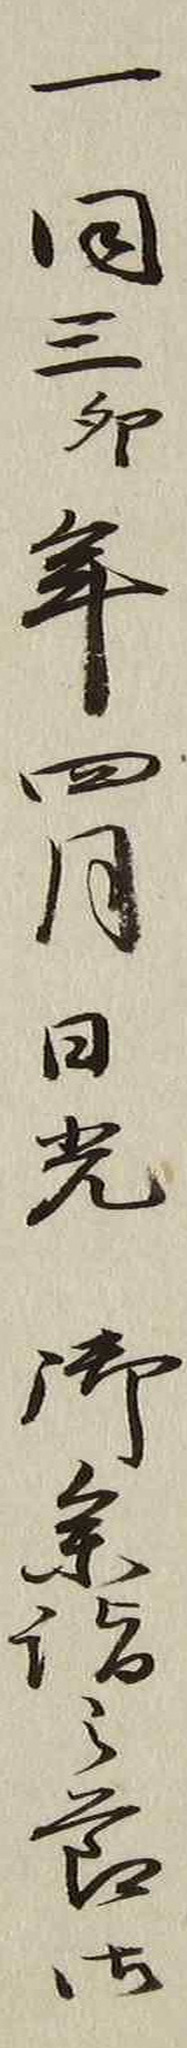一同三卯年四月日光御参詣之節御
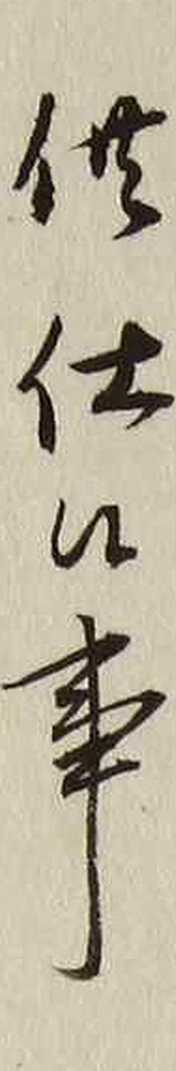供仕候事
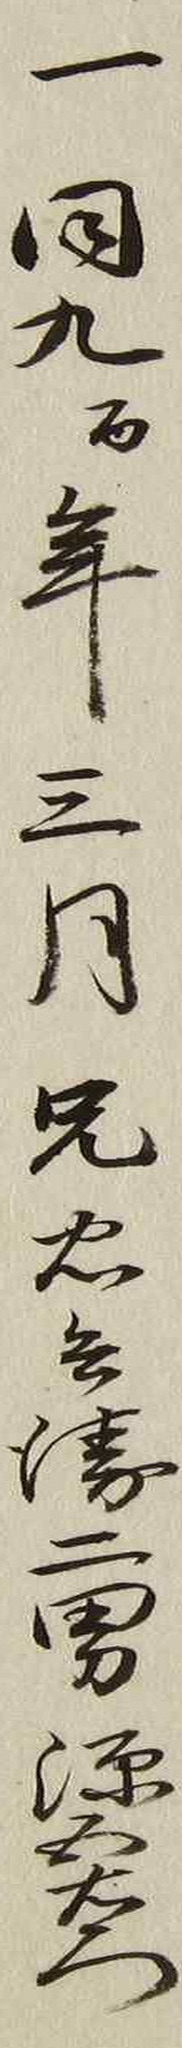一同九酉年三月兄忠兵衛二男源五右衛門
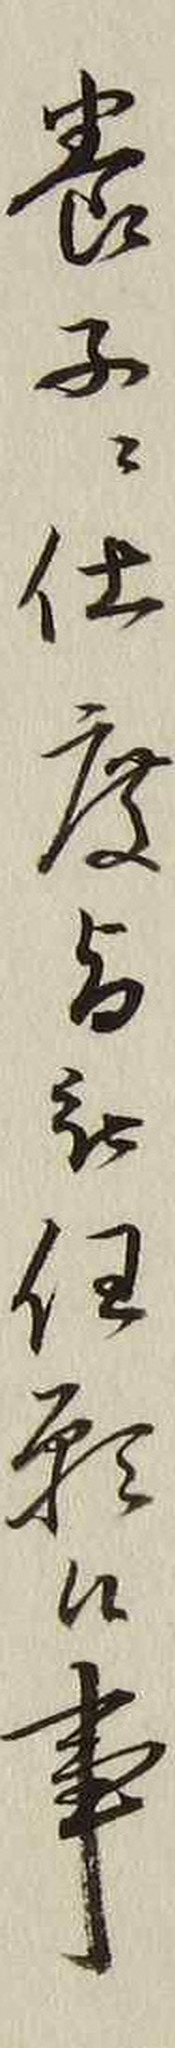養子ニ仕度旨被任願候事
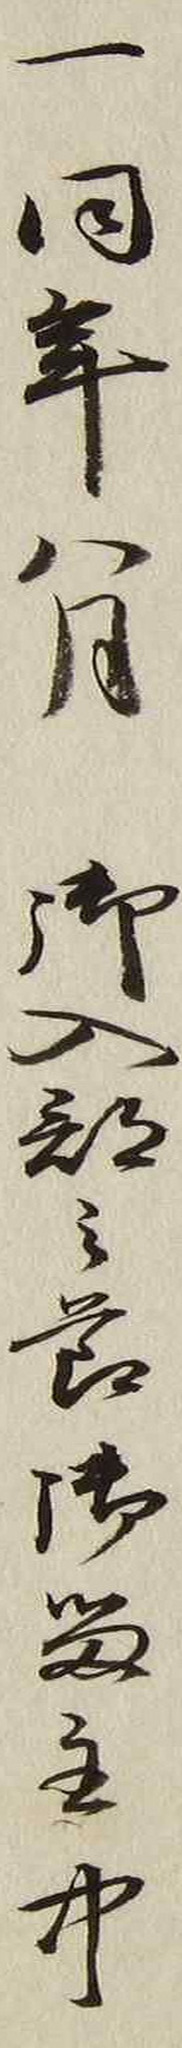一同年八月御入部之節御留主中
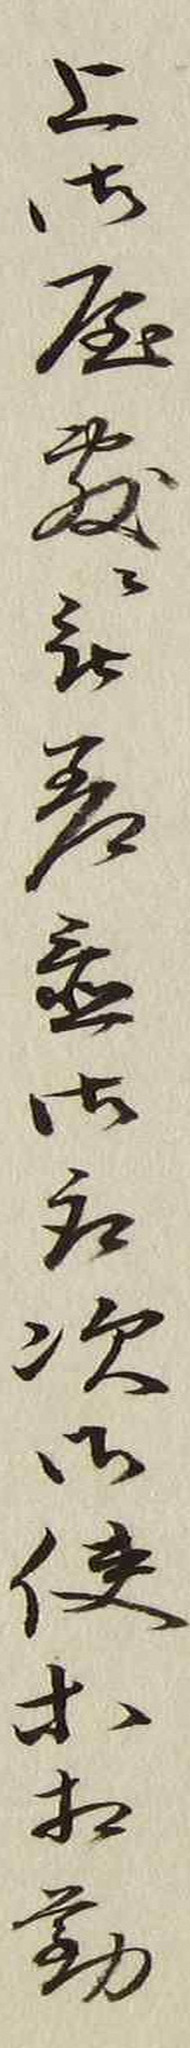上御屋敷ニ被差置御取次御使等相勤
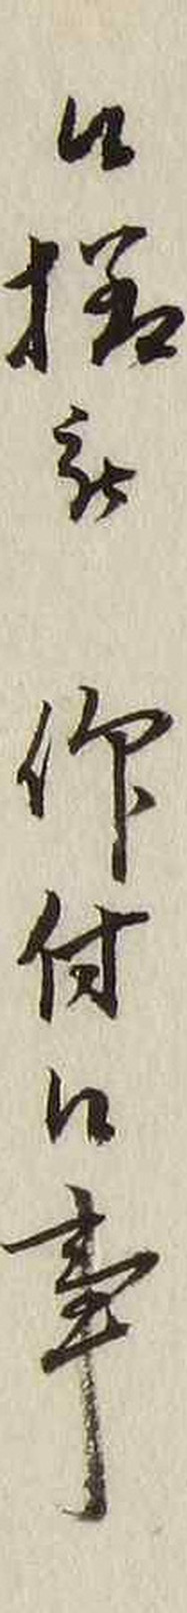候様被仰付候事
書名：諸士系譜　巻之160　な之部2
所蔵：会津若松市立会津図書館
